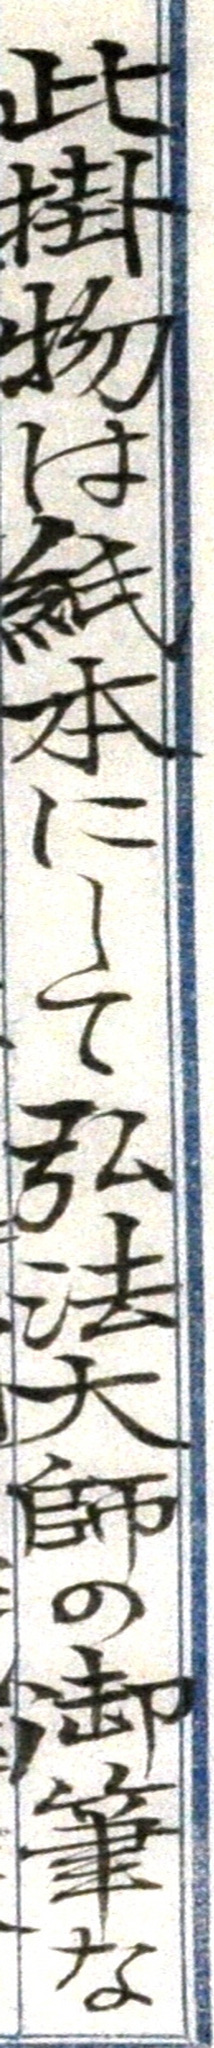此掛物は紙本にして弘法大師の御筆な
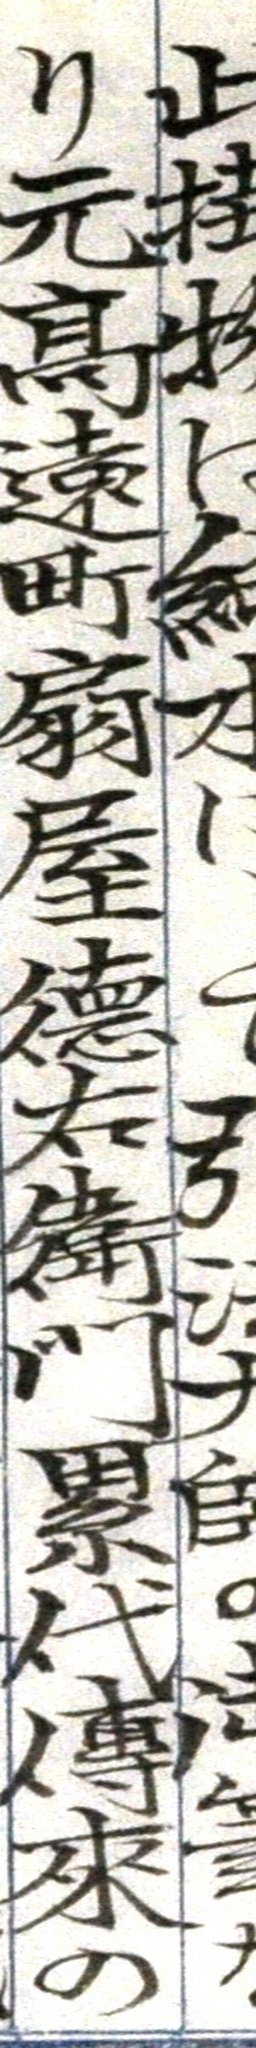り元高遠町扇屋徳右衛門累代伝来の
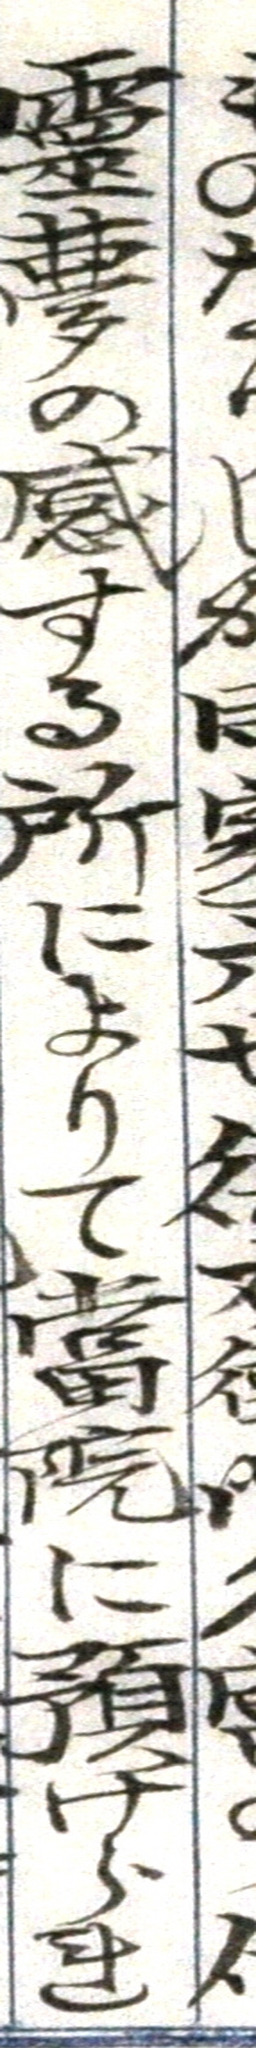霊夢の感する所によりて当院に預けられ
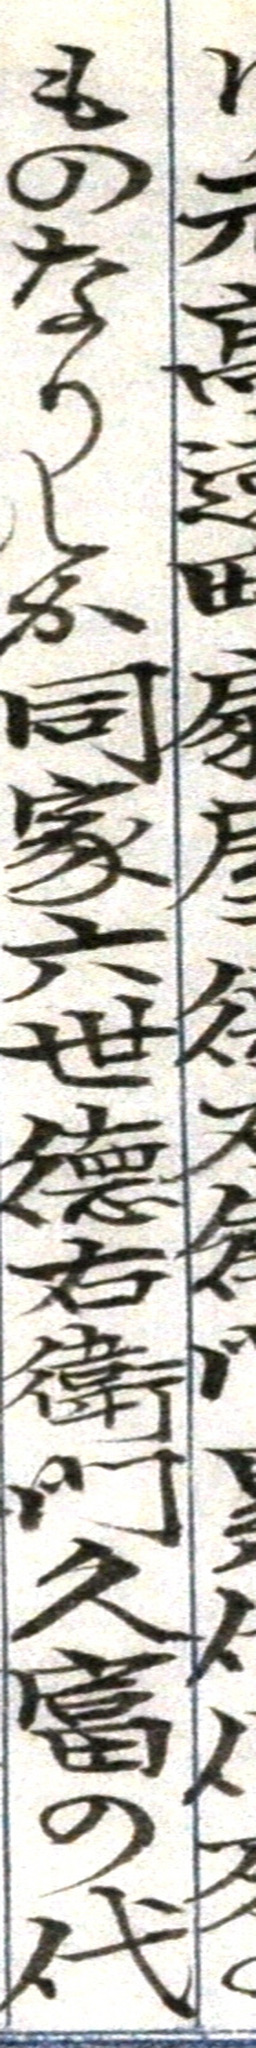ものなりしか同家六世徳右衛門久富の代
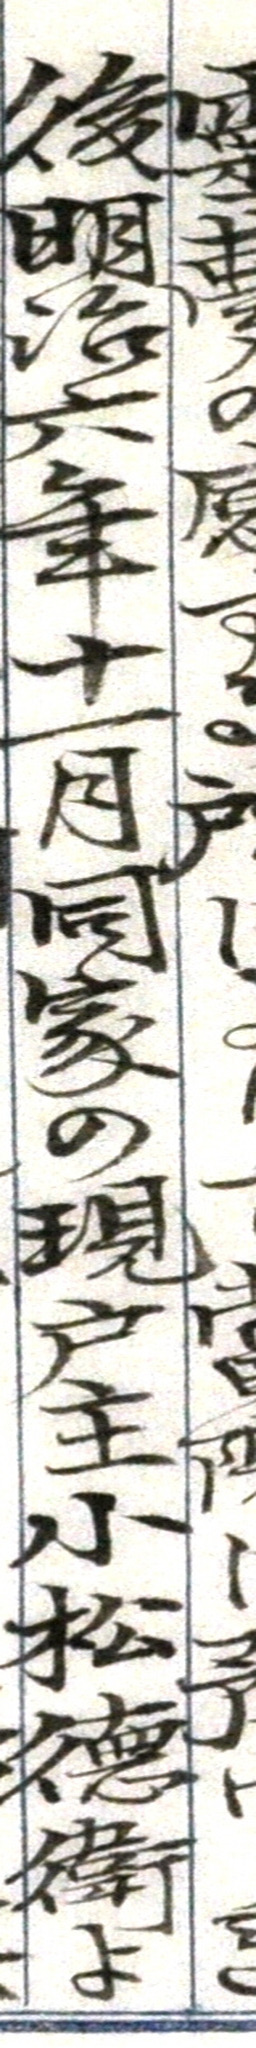後明治六年十一月同家の現戸主小松徳衛よ
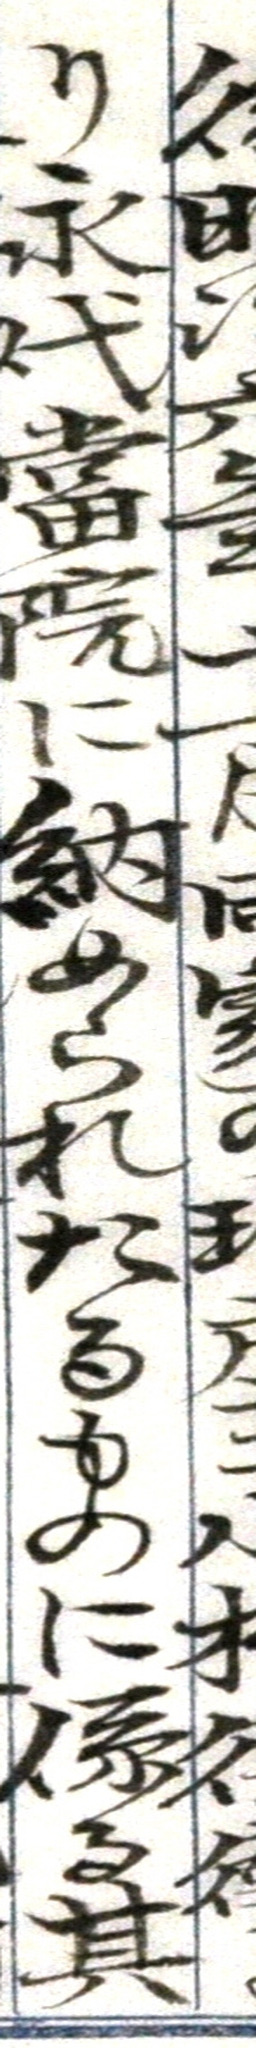り永代当院に納められたるものに係る其
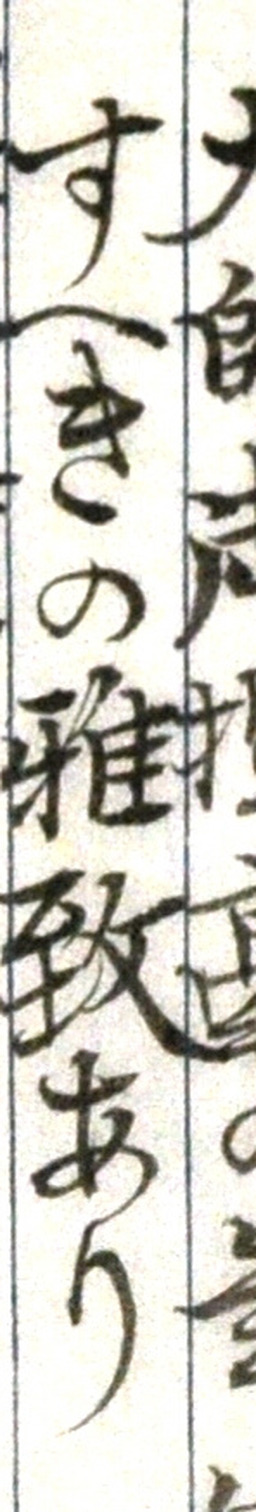すへきの雅致あり
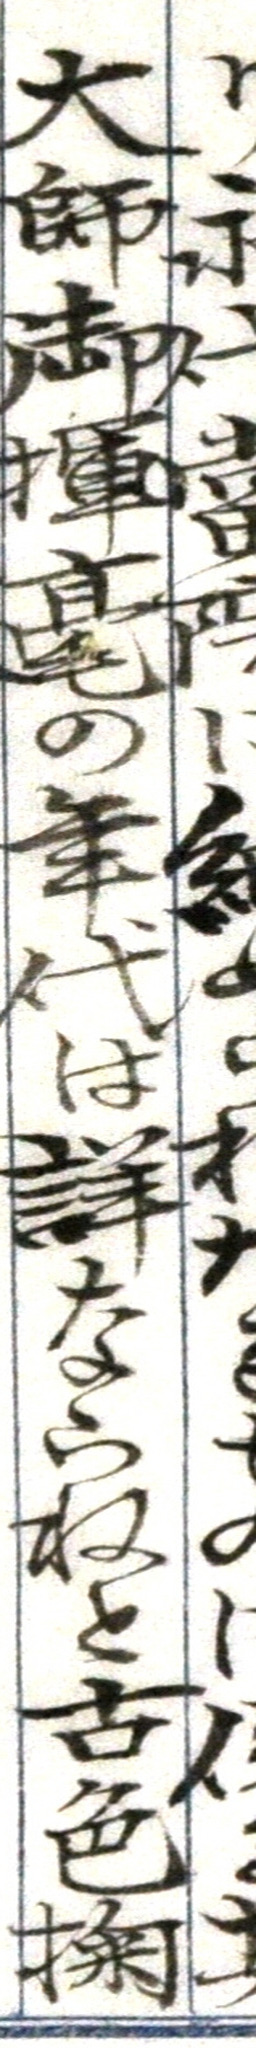大師御揮毫の年代は詳ならねと古色掬
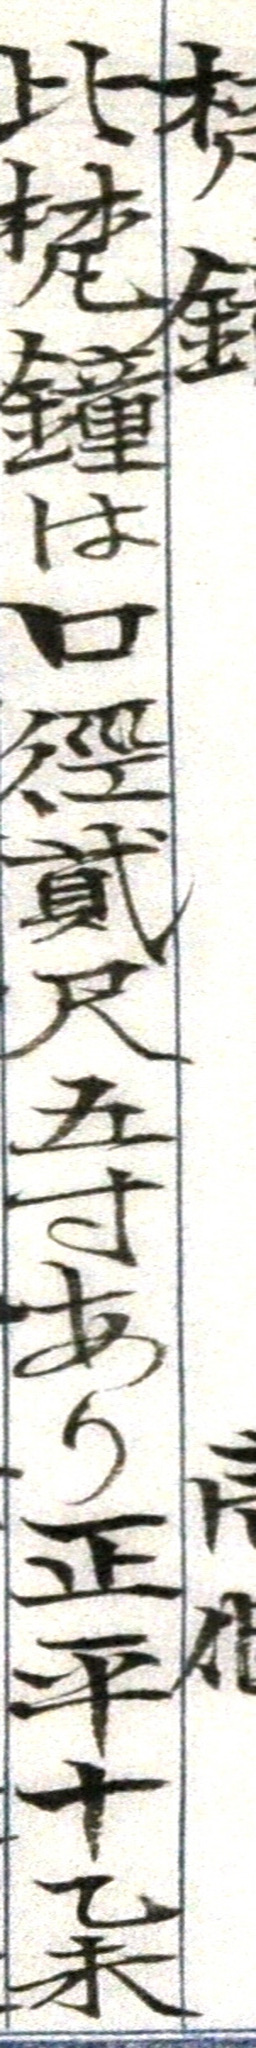此梵鐘は口径弐尺五寸あり正平十乙未
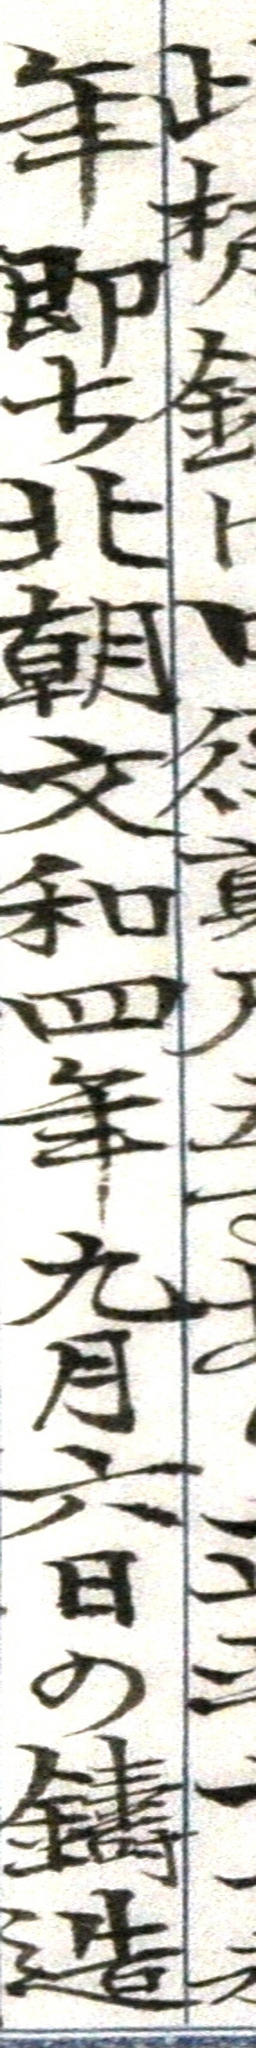年即ち北朝文和四年九月六日の鋳造
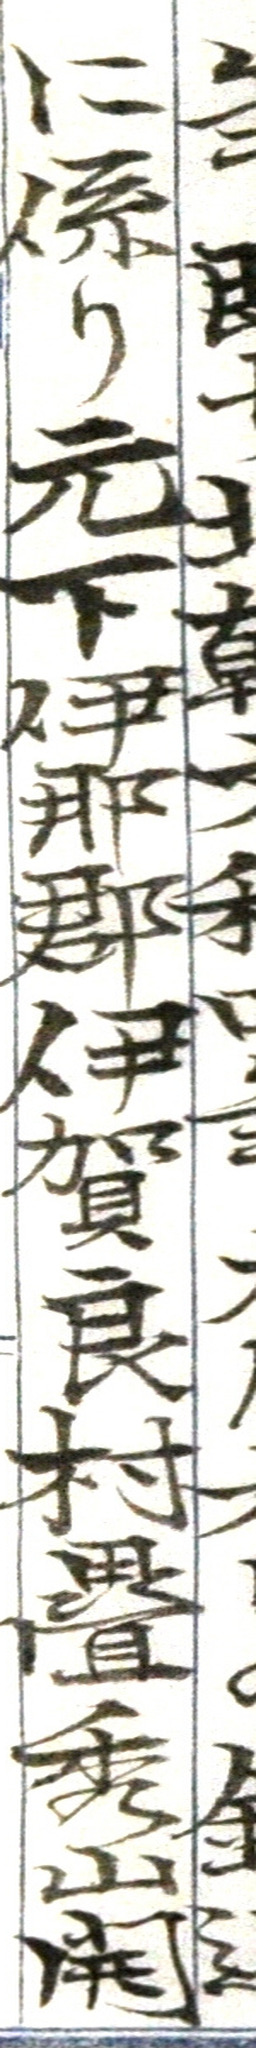に係り元下伊那郡伊賀良村塁秀山開

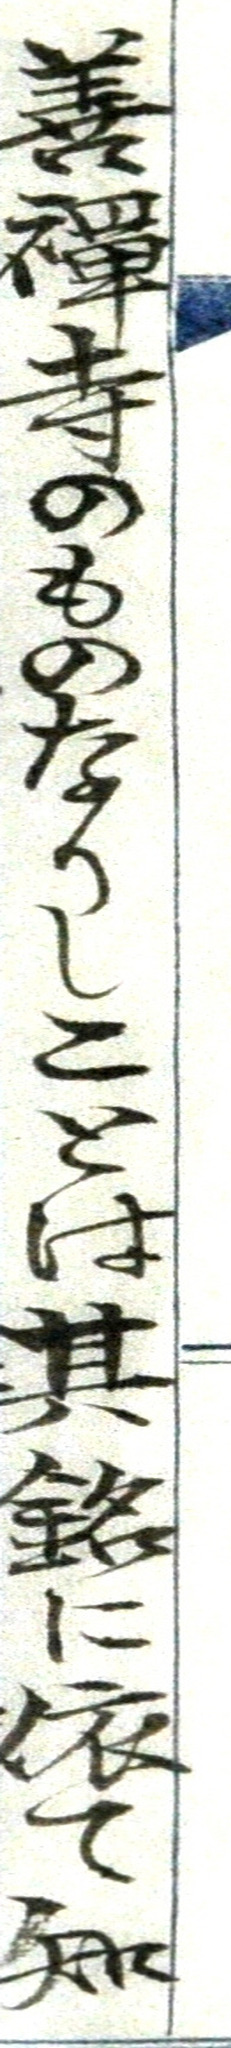善禅寺のものなりしことは其銘に依て知
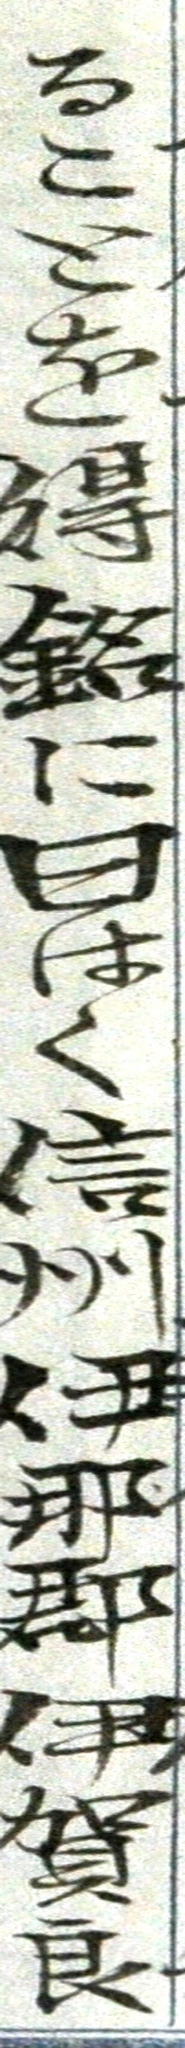ることを得銘に曰はく信州伊那郡伊賀良
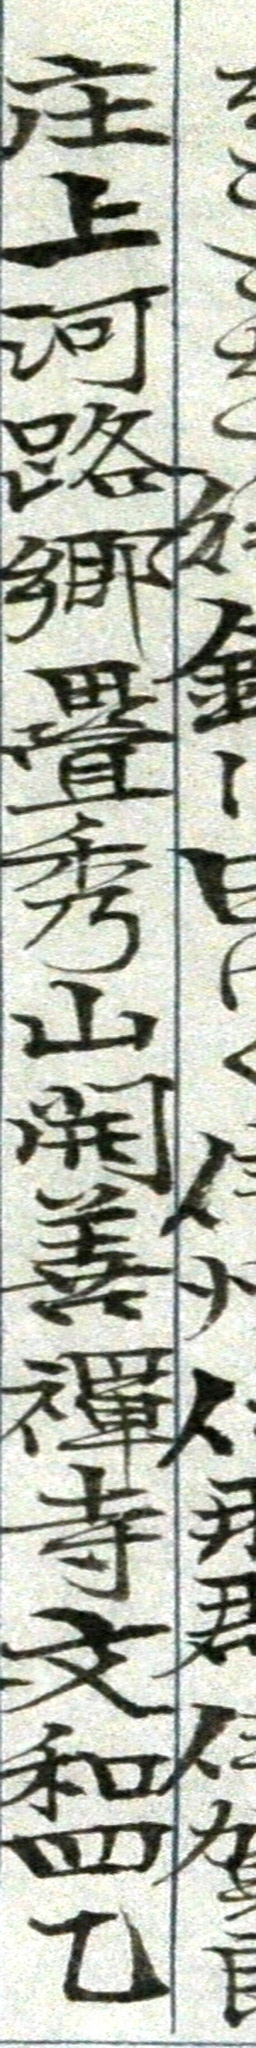庄上河路郷畳秀山開善禅寺文和四乙
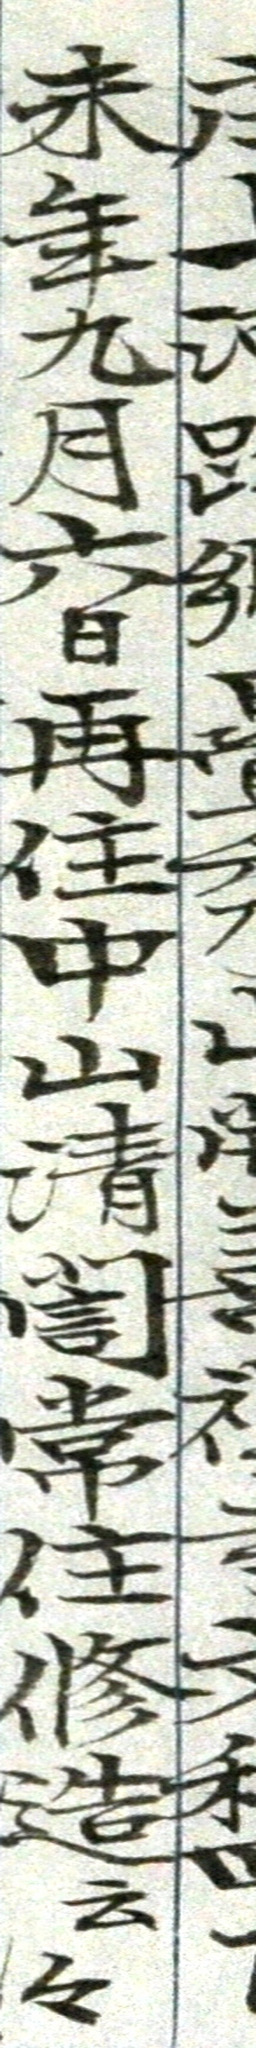未年九月六日再住中山清誾常住修造云々
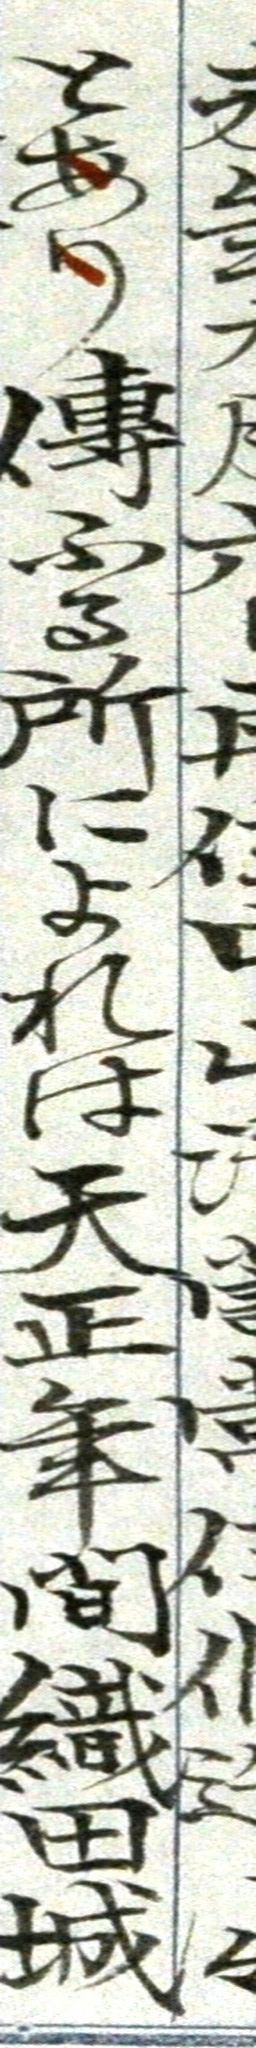とあり伝ふる所によれは天正年間織田城
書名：桂泉院・樹林寺・東光寺縁起書、蓮華寺由来書、付夕顔観音記
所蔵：伊那市立高遠町図書館・合同会社AMANE
